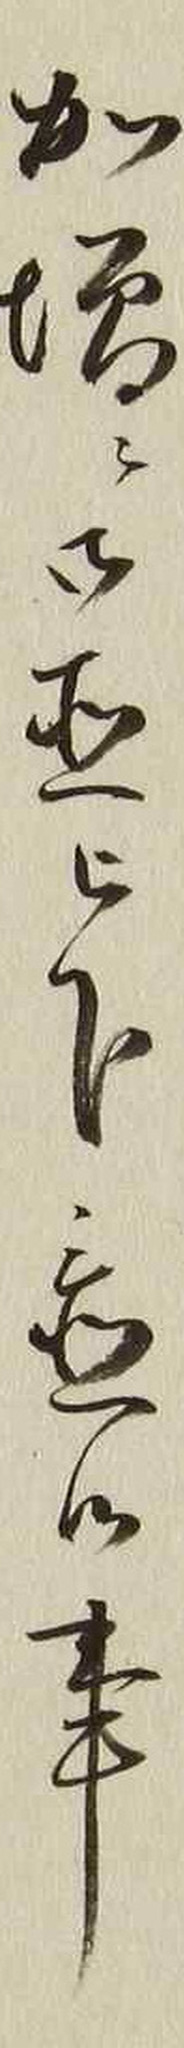加増ニ御直被下置候事
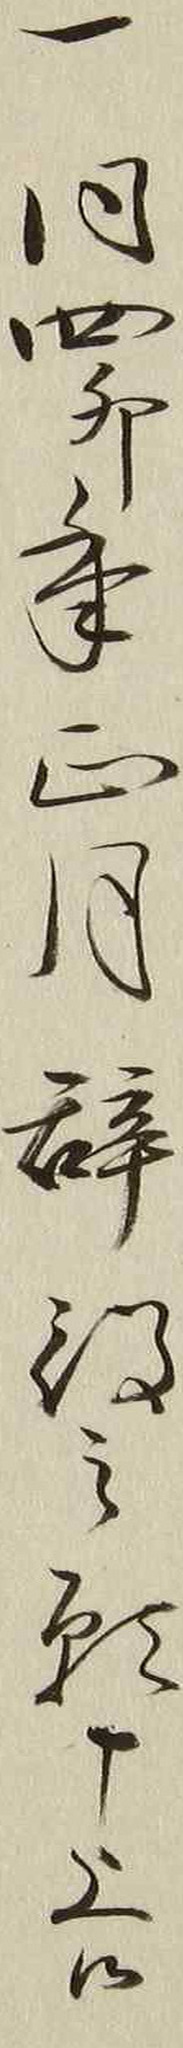一同四卯年正月辞役之願申上候
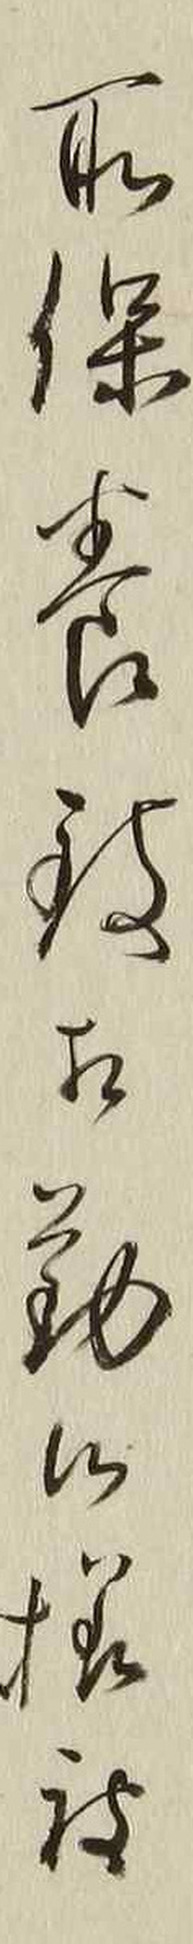所保養致相勤候様被
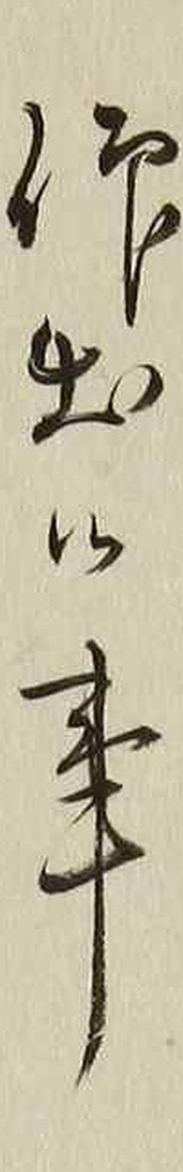仰出候事
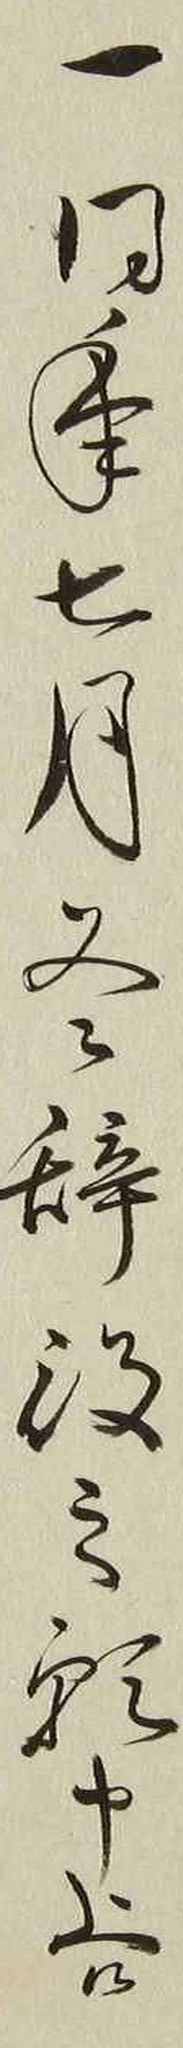一同年七月又々辞役之願申上候
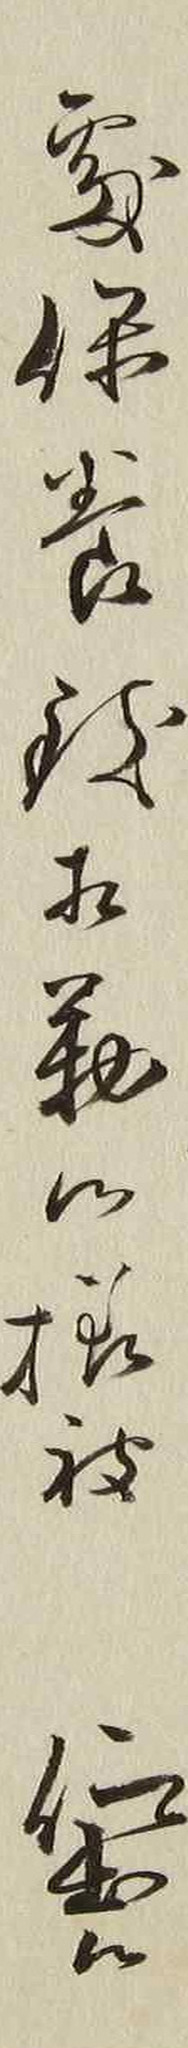処保養致相勤候様被仰出候
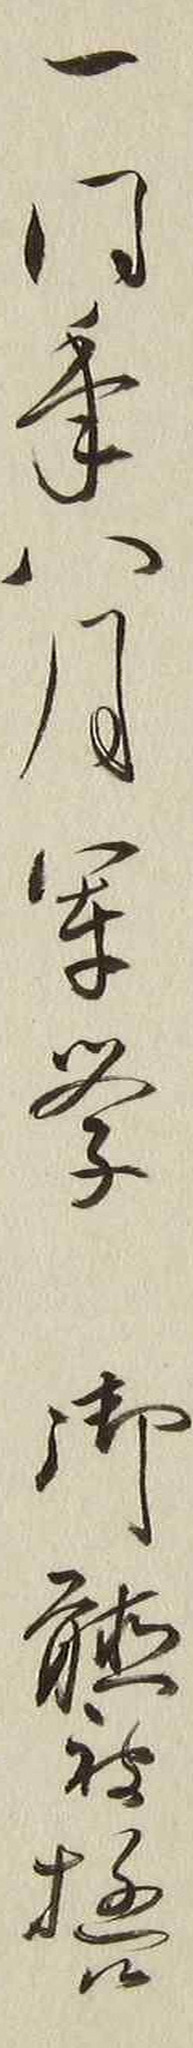一同年八月軍学御聴被遊候
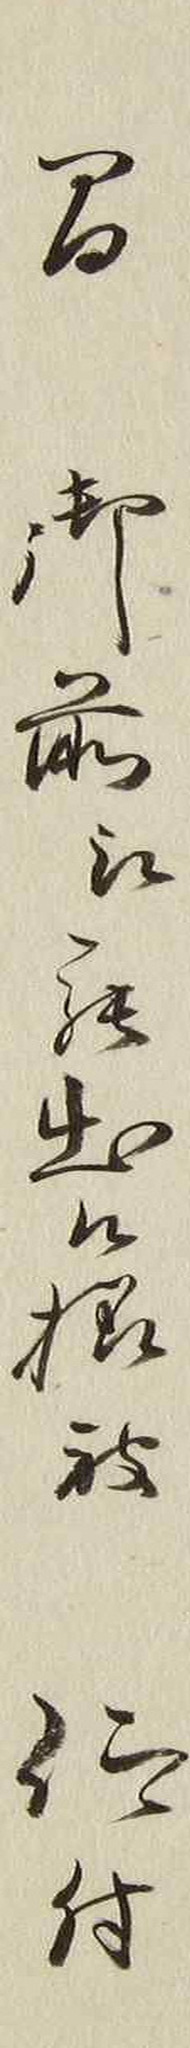間御前ぇ罷出候様被仰付
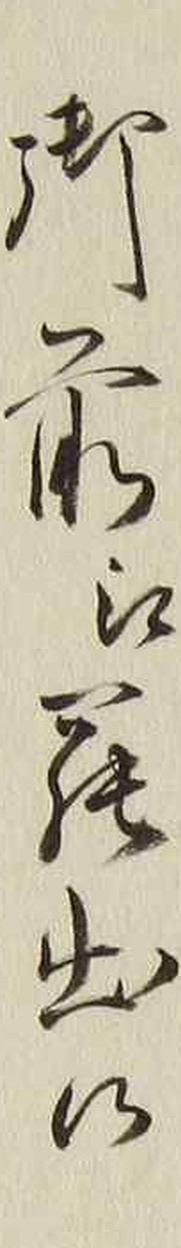御前ぇ罷出候
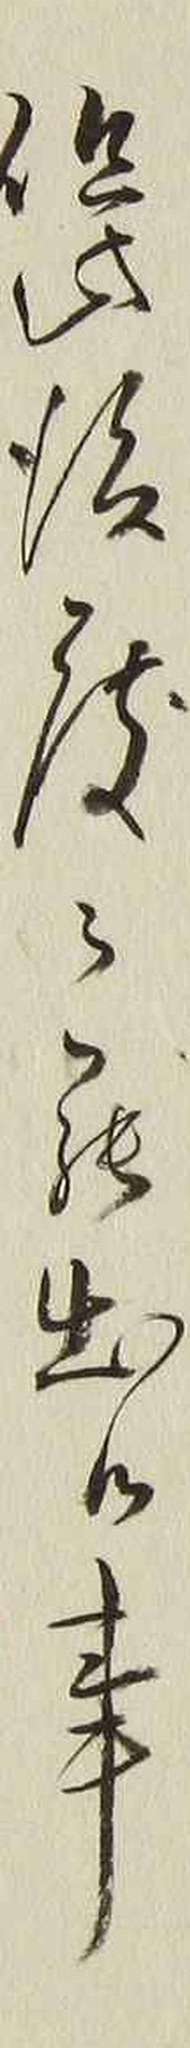但此後度々罷出候事
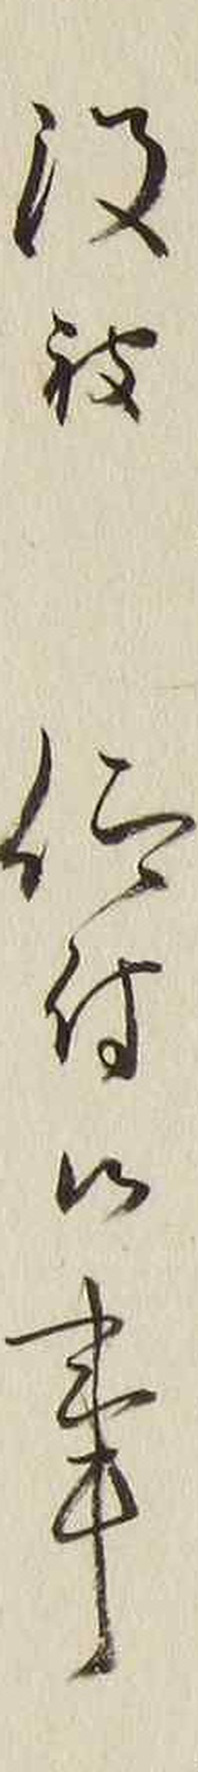役被仰付候事
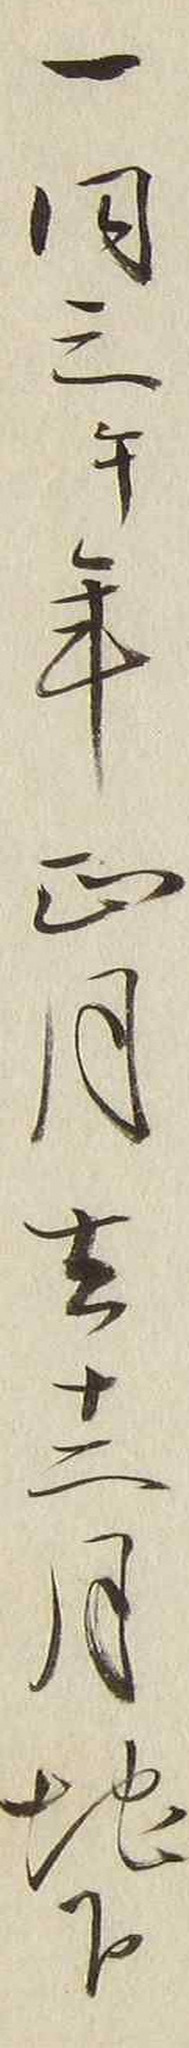一同三午年正月去十二月地下

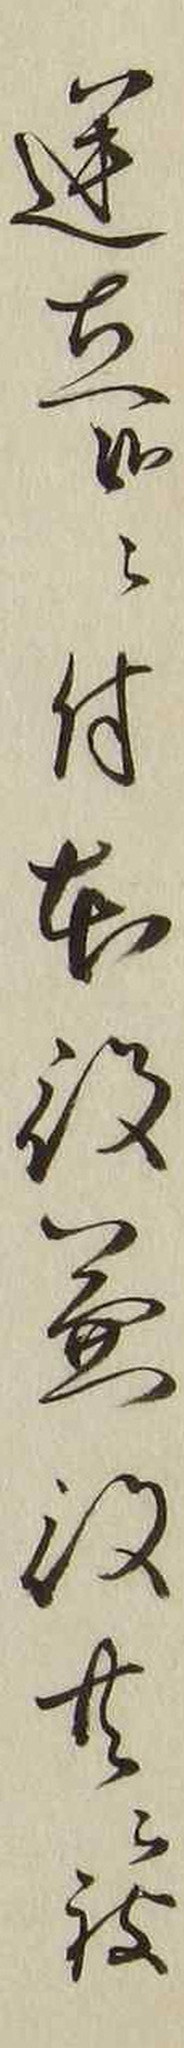逆立候ニ付本役兼役共ニ被
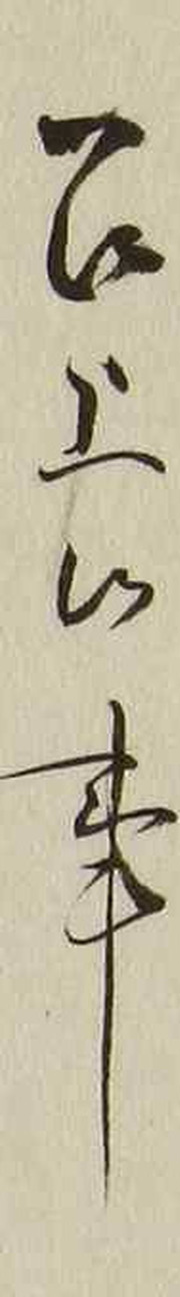召上候事
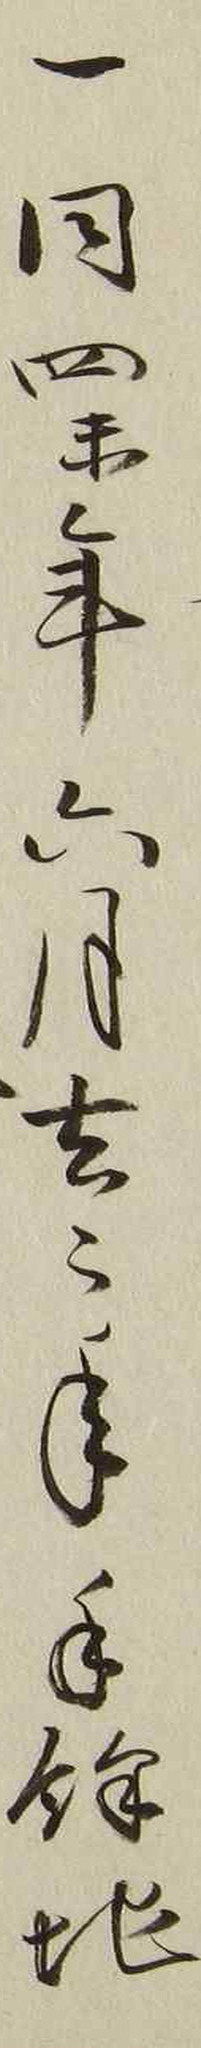一同四未年六月去々年手余地
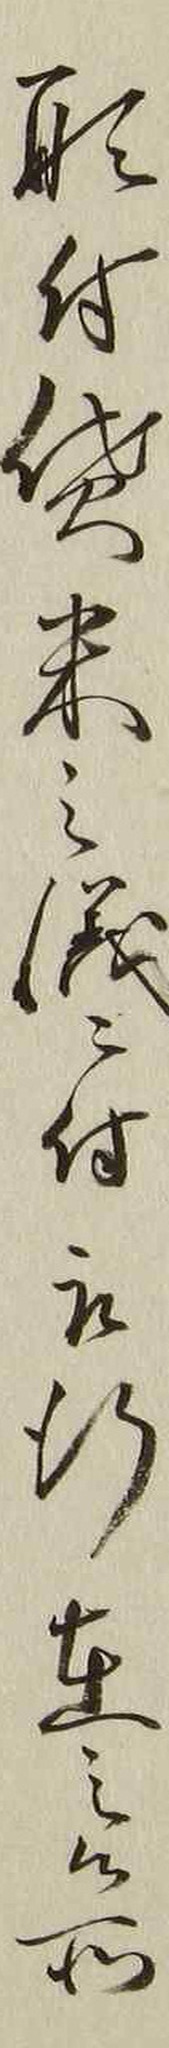形付貸米之儀ニ付取行在之候所
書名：諸士系譜　巻之163　な之部5
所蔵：会津若松市立会津図書館
